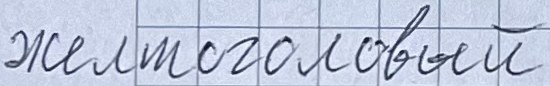желтоголовый
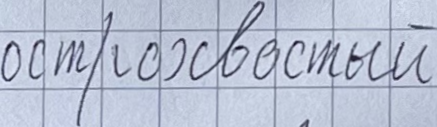острохвостый
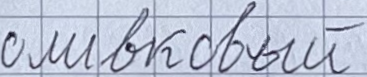оливковый
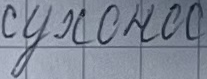сухонос
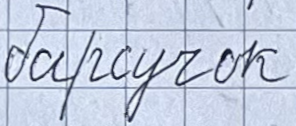барсучок
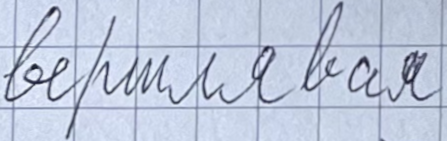вертлявая
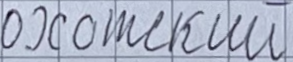охотский
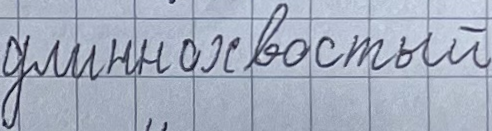длиннохвостый
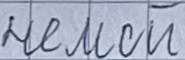немой
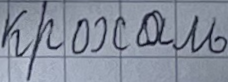крохаль
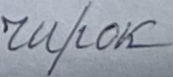чирок
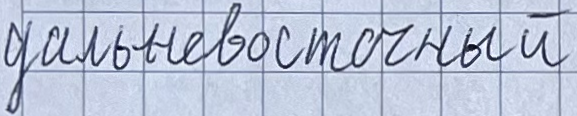дальневосточный
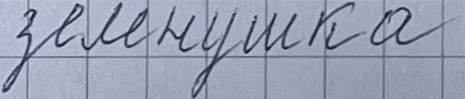зеленушка
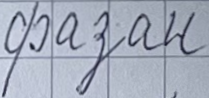фазан
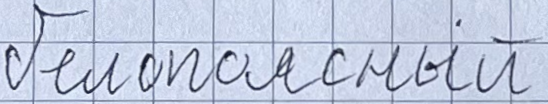белопоясный
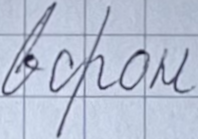ворон
